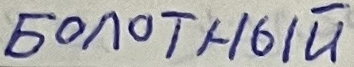болотный
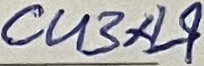сизая
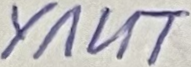улит
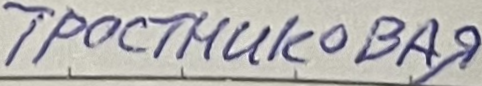тростниковая
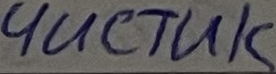чистик
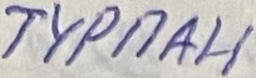турпан
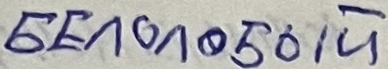белолобый
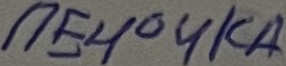пеночка
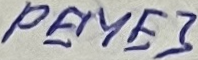ремез
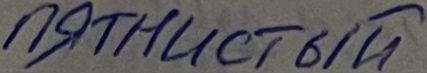пятнистый
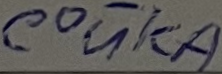сойка
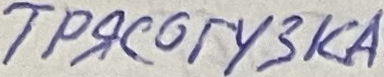трясогузка
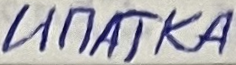ипатка
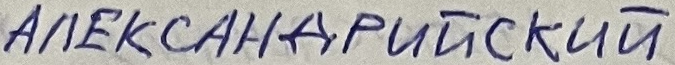александрийский
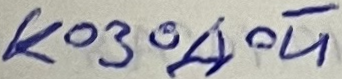козодой
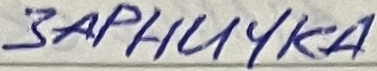зарничка
